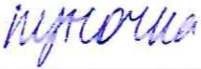пуночка
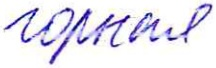горная
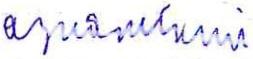азиатский
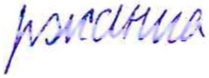ржанка
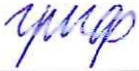гриф
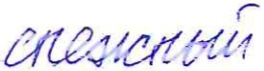снежный
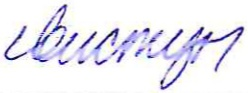свистун
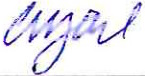сизая
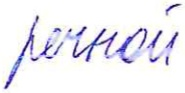речной
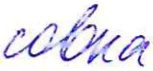совка
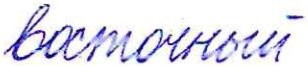восточный
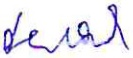белая
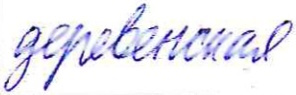деревенская
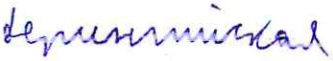берингийская
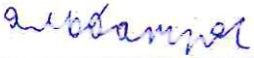альбатрос
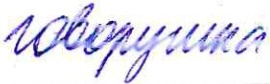говорушка
